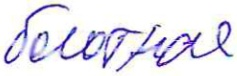болотная
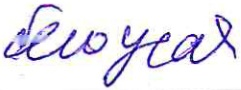белоусая
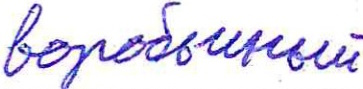воробьиный
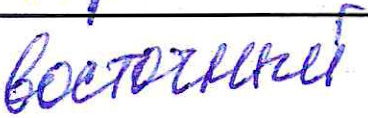восточный
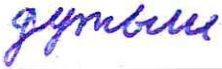дутыш
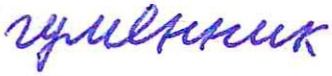гуменник
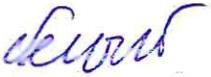белый
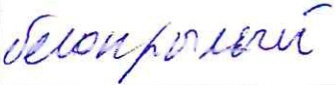белокрылый
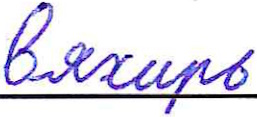вяхирь
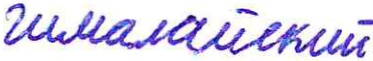гималайский
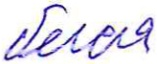бегая
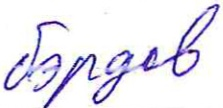бэрдов
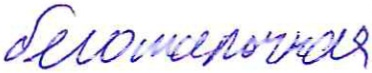белошапочная
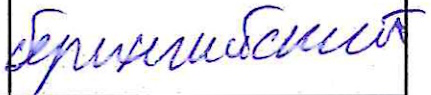берингийский
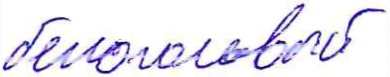белоголовый
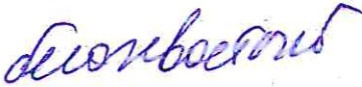белохвостый
